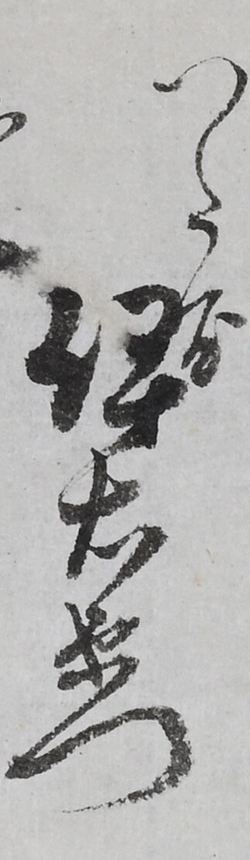伊右衛門
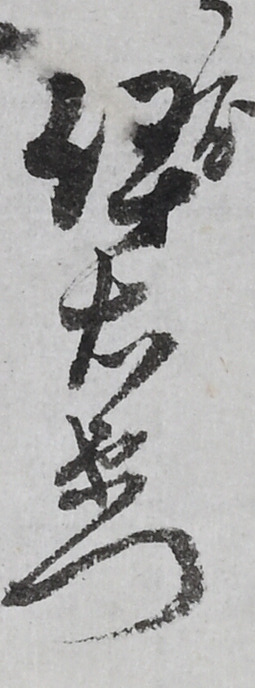伊右衛門
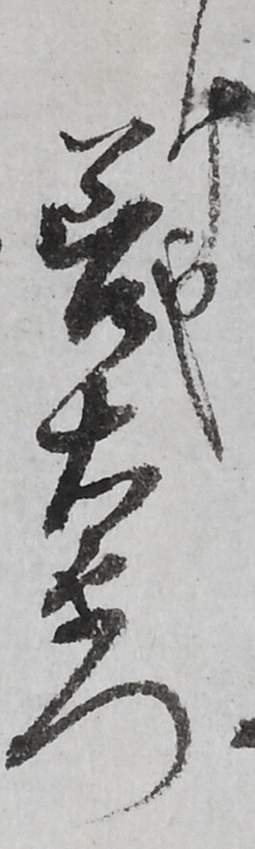善右衛門
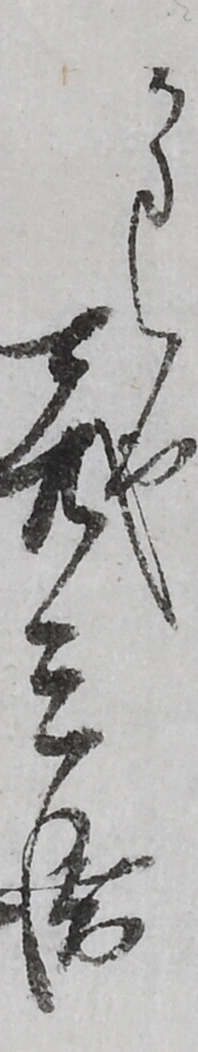喜兵衛
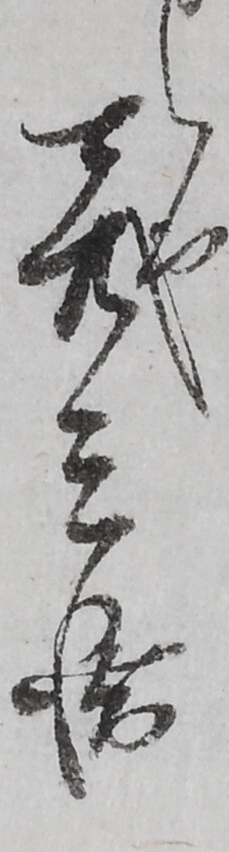喜兵衛
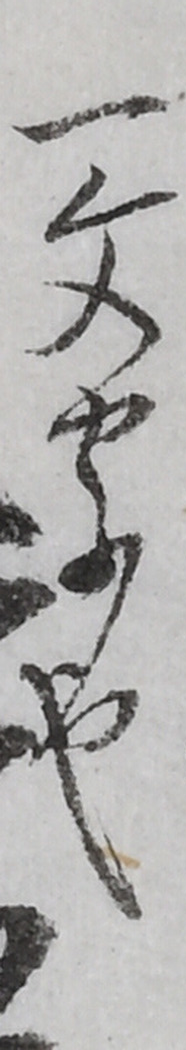一文字や
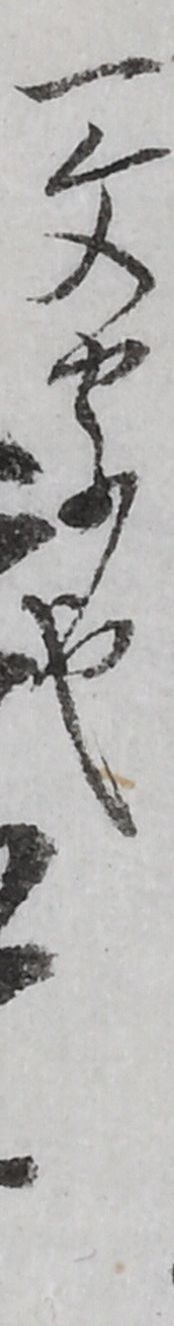一文字や
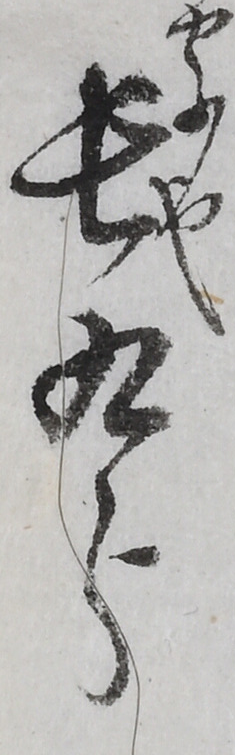長九郎
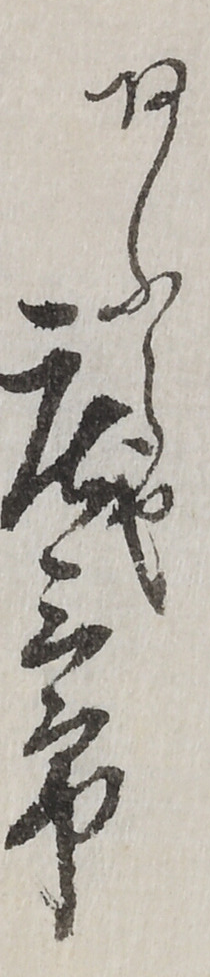庄三郎
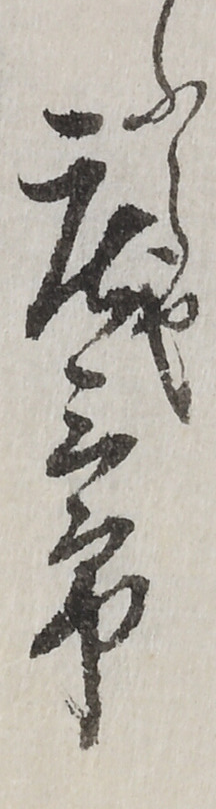庄三郎
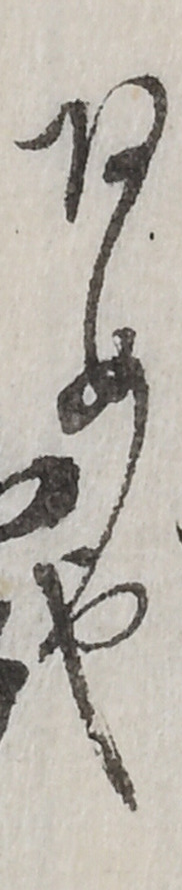あめや
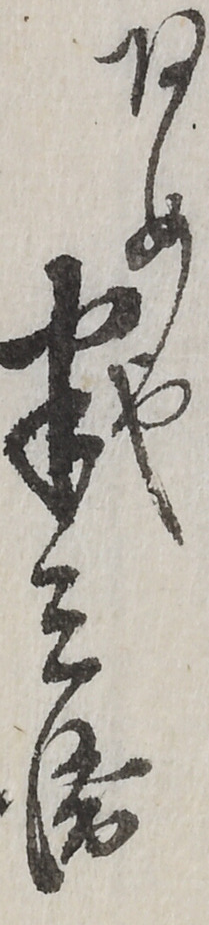半兵衛
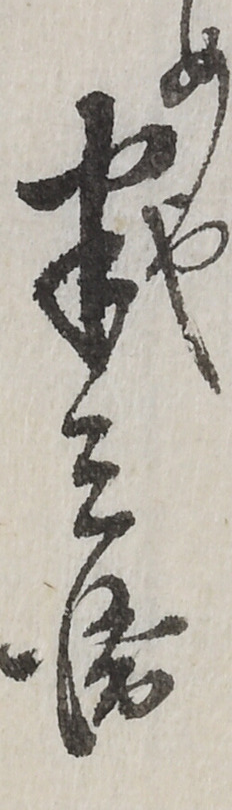半兵衛
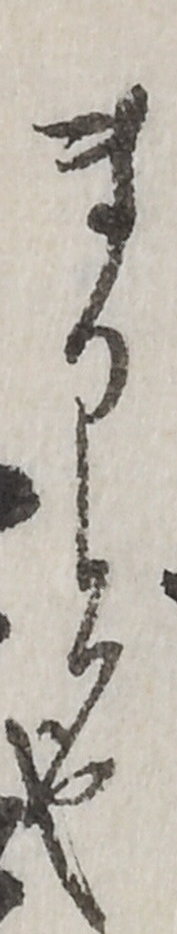まかとや
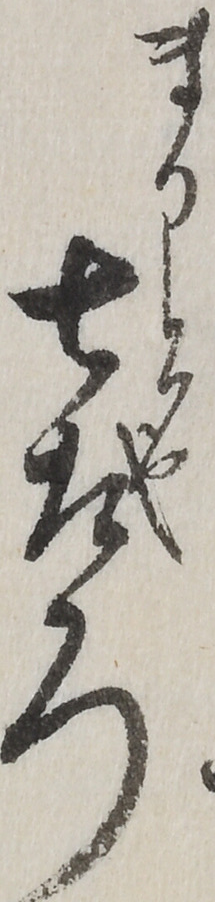七左衛門
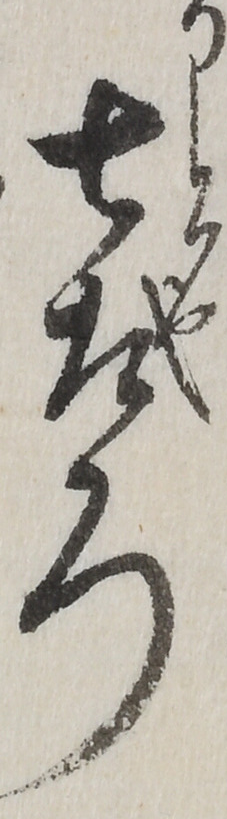七左衛門
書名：當町火消道具幷役附帳
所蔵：伊那市立高遠町図書館・合同会社AMANE
